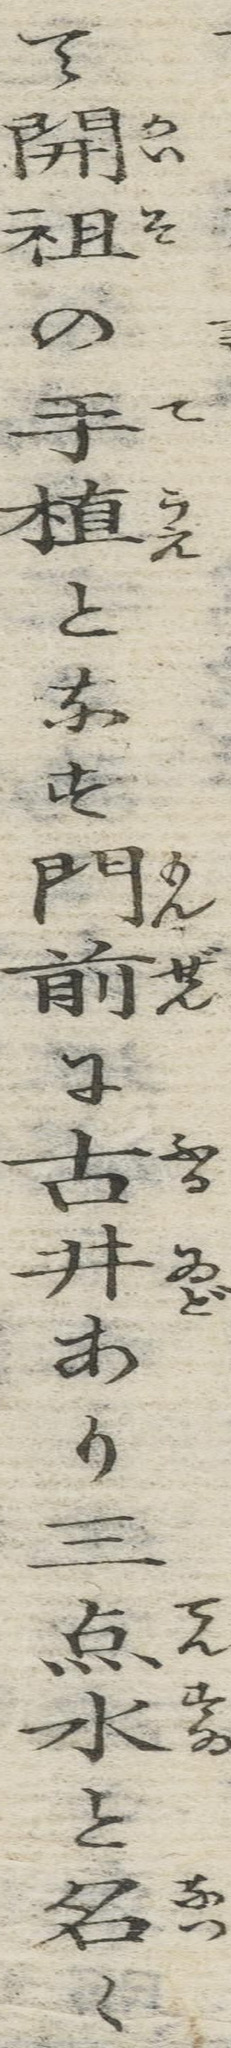て開祖の手植となす門前に古井あり三点水と名く
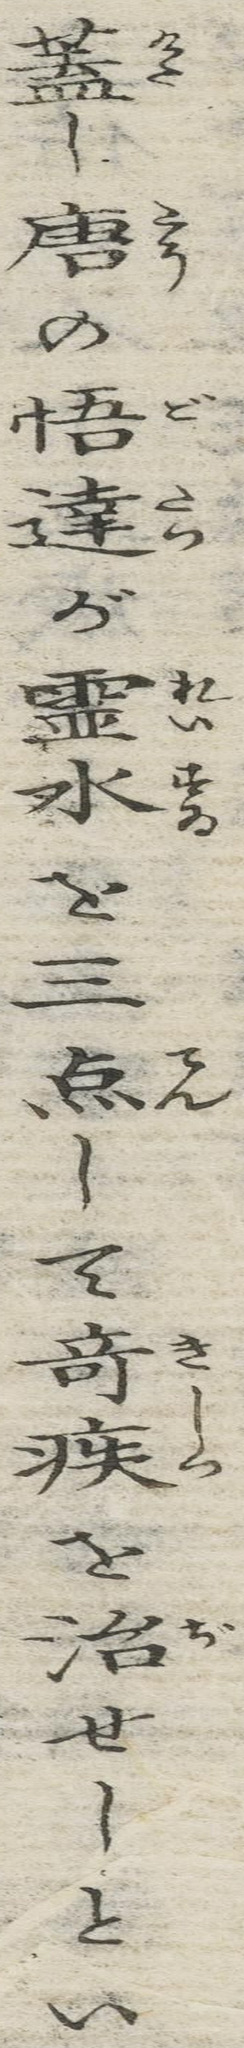蓋し唐の悟達が霊水を三点して奇疾を治せしとい
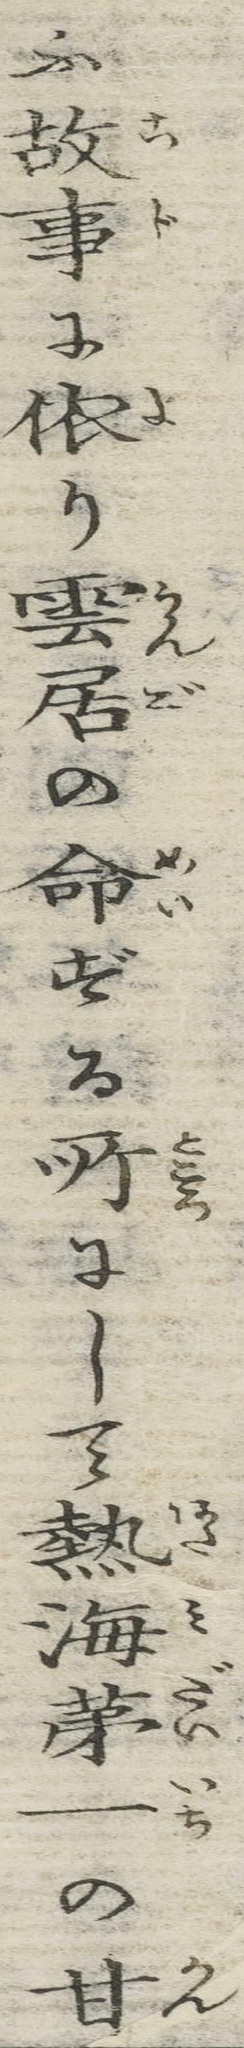ふ故事に依り雲居の命ずる所にして熱海第一の甘
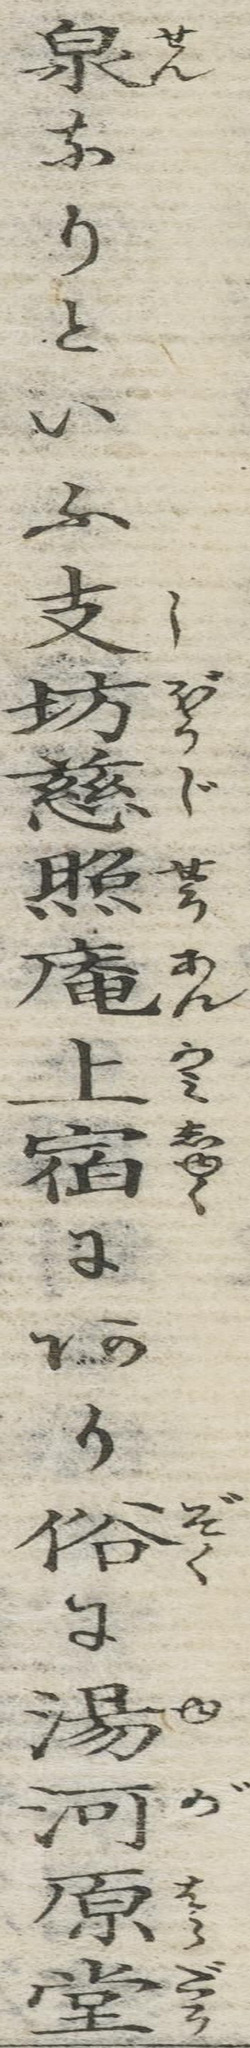泉なりといふ支坊慈照庵上宿にあり俗に湯河原堂
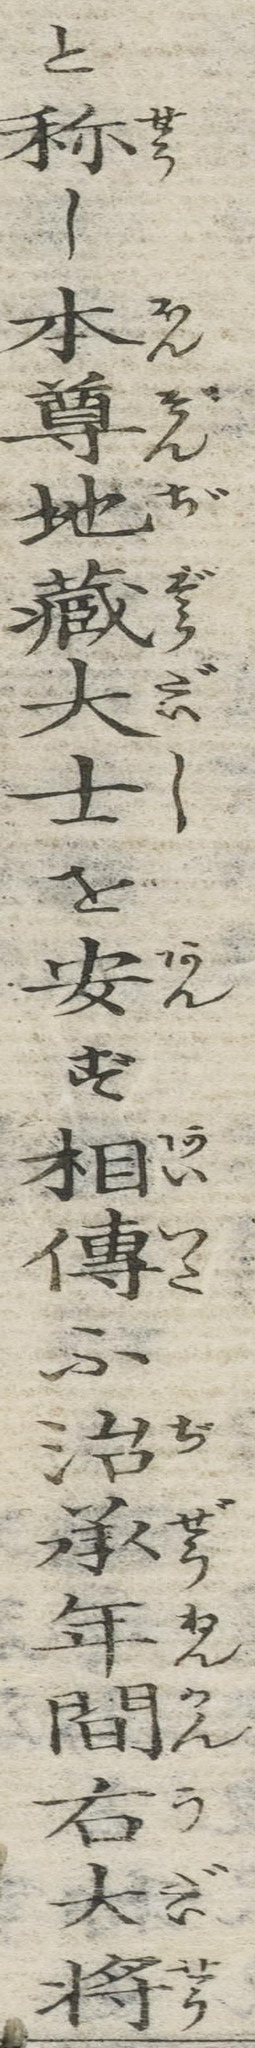と称し本尊地蔵大士を安ず相伝ふ治承年間右大将
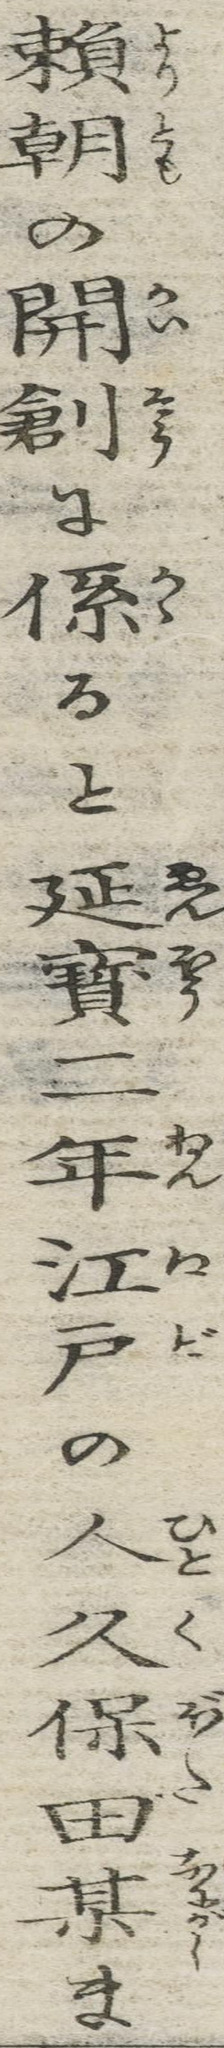頼朝の開創に係ると延宝二年江戸の人久保田某ま
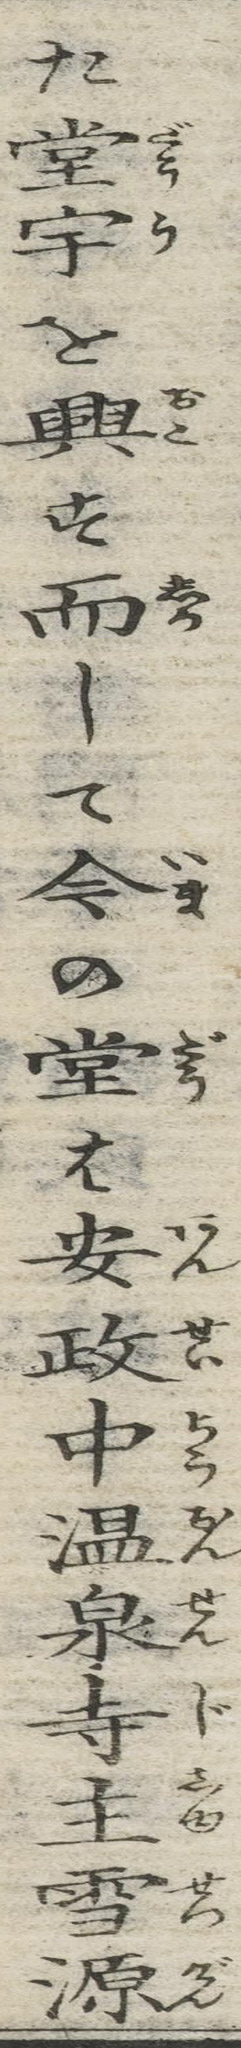た堂宇を興す而して今の堂は安政中温泉寺主雪源

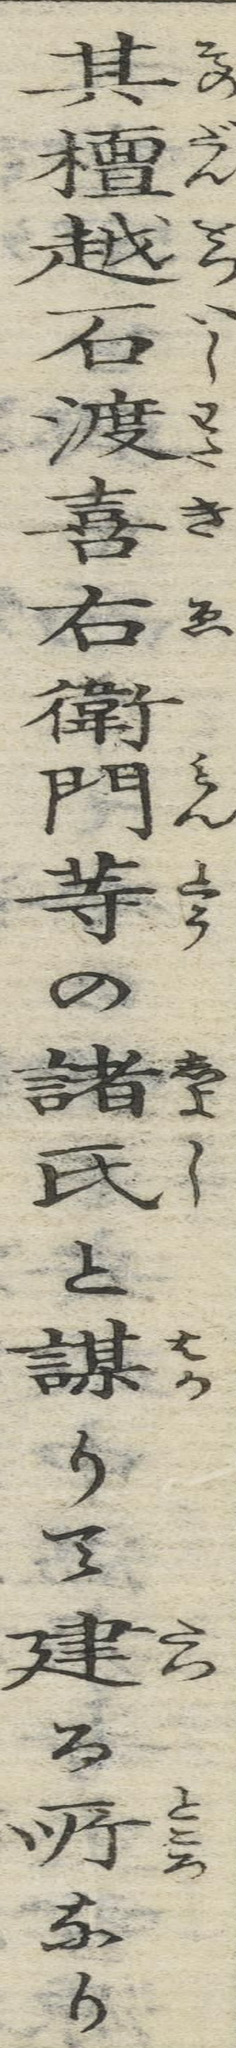其檀越石渡喜右衛門等の諸氏と謀りて建る所なり
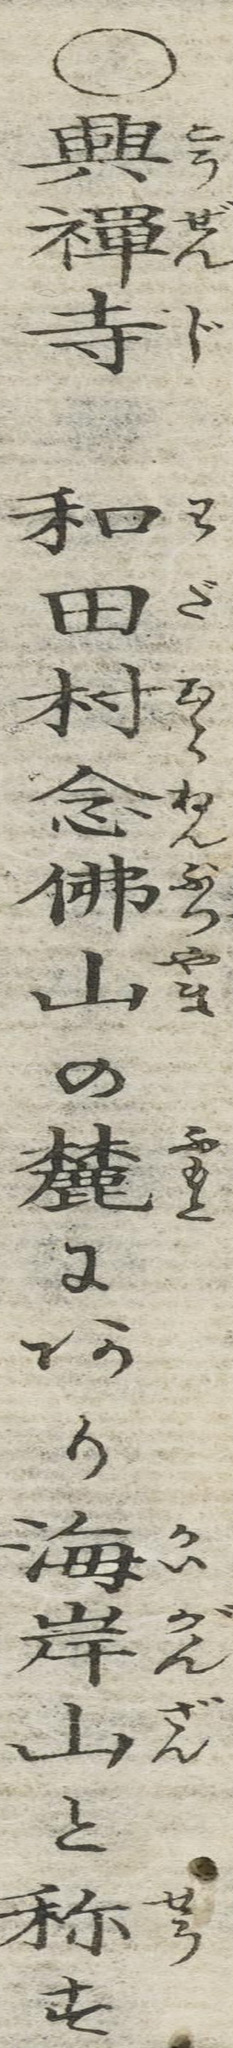○興禅寺和田村念仏山の麓にあり海岸山と称す
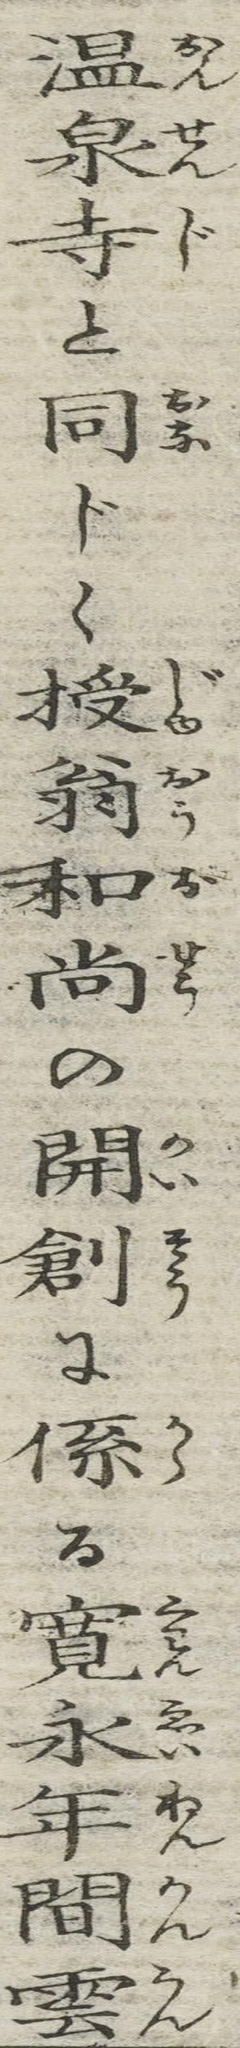温泉寺と同じく授翁和尚の開創に係る寛永年間雲
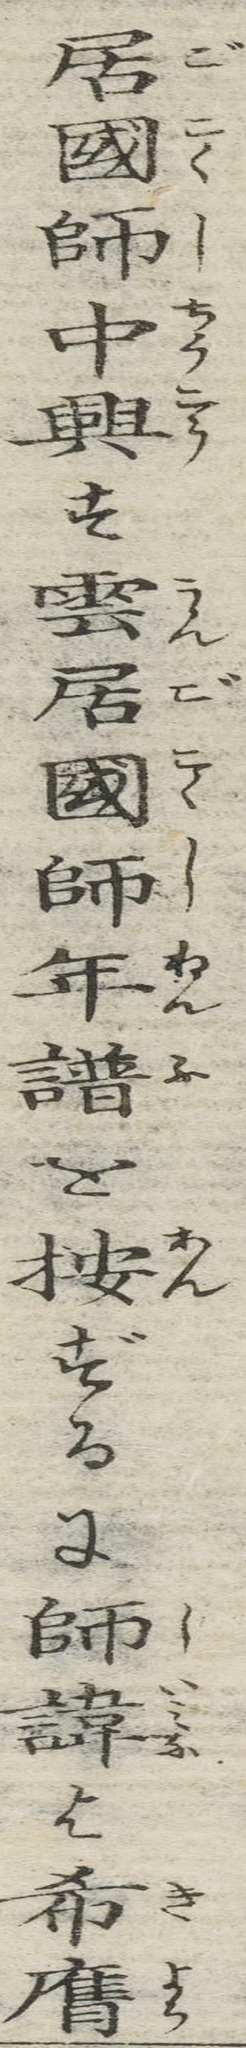居国師中興す雲居国師年譜を按ずるに師諱は希膺
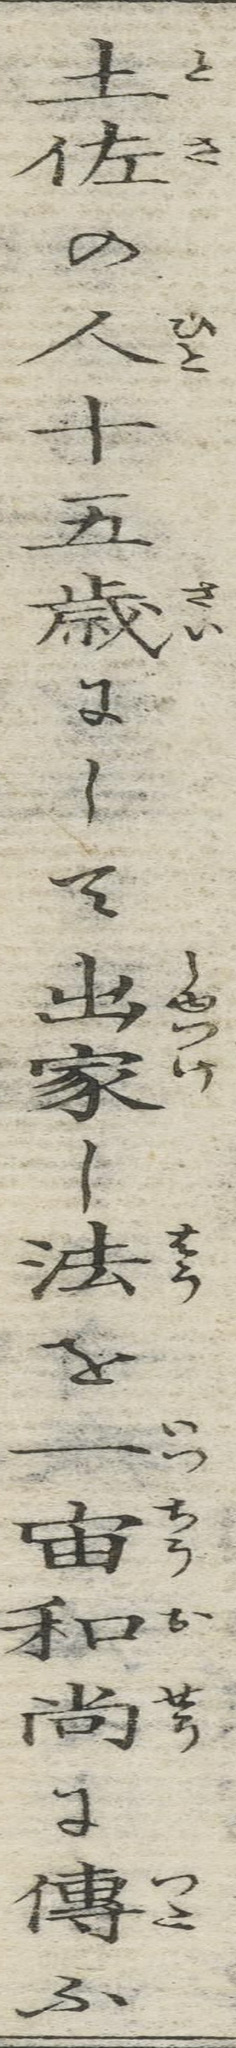土佐の人十五歳にして出家し法を一宙和尚に伝ふ
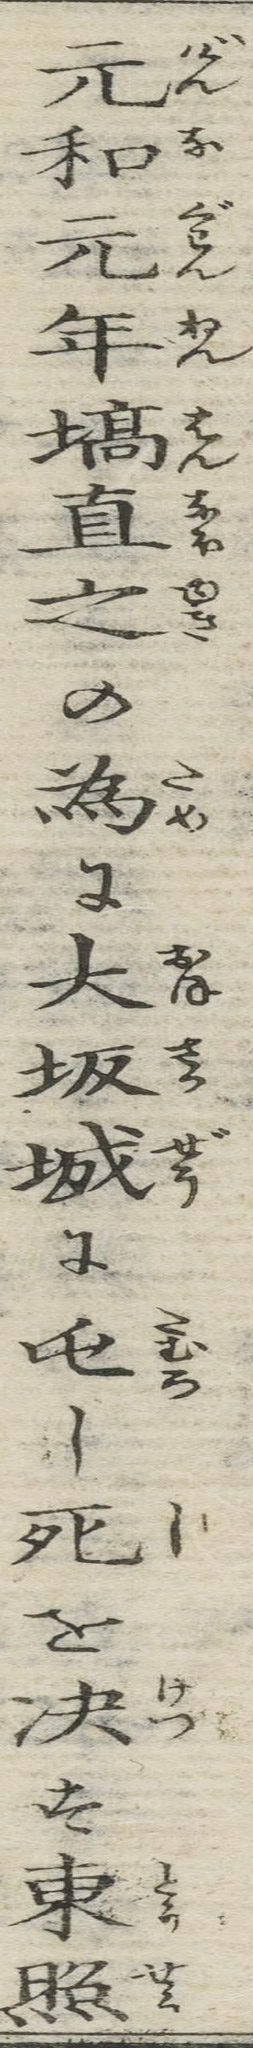元和元年塙直之の為に大坂城に屯し死を決す東照
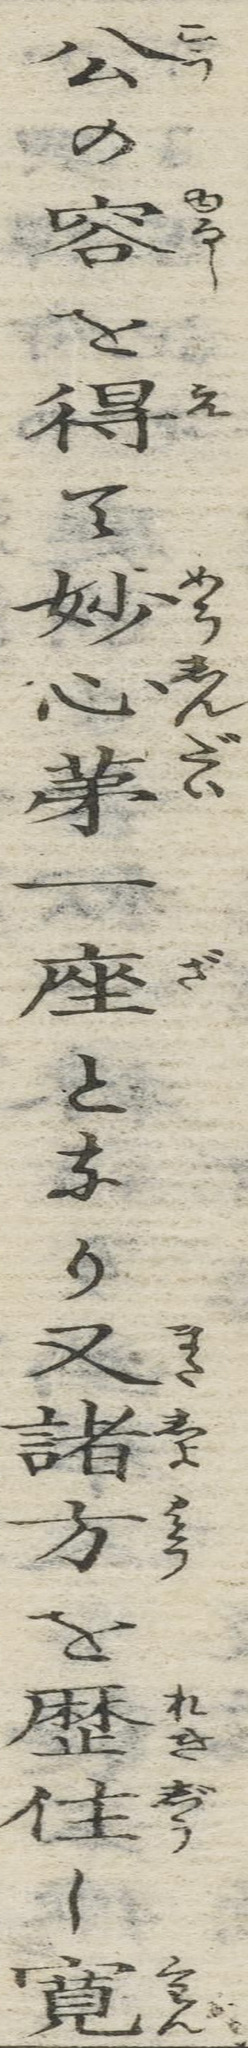公の容を得て妙心第一座となり又諸方を歴住し寛
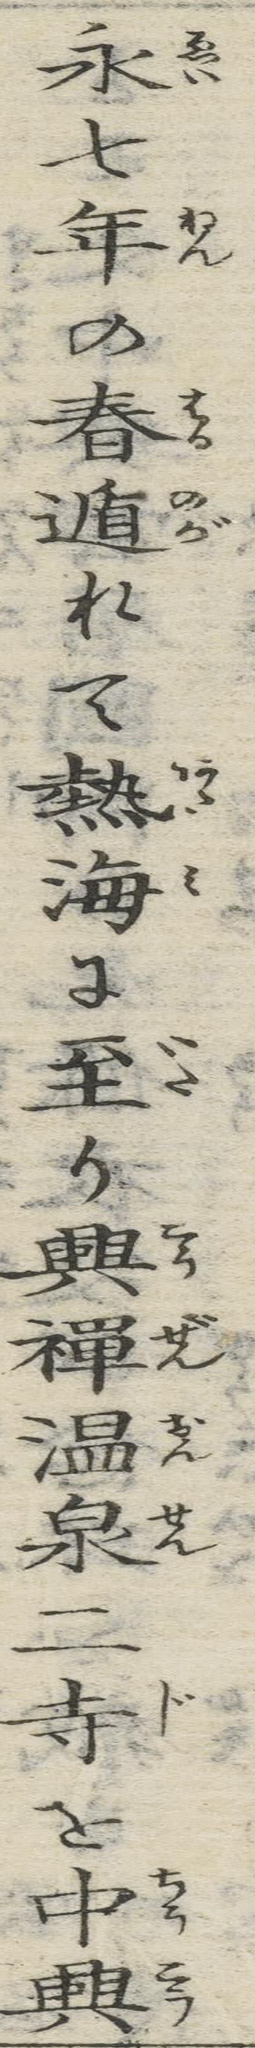永七年の春遁れて熱海に至り興禅温泉二寺を中興
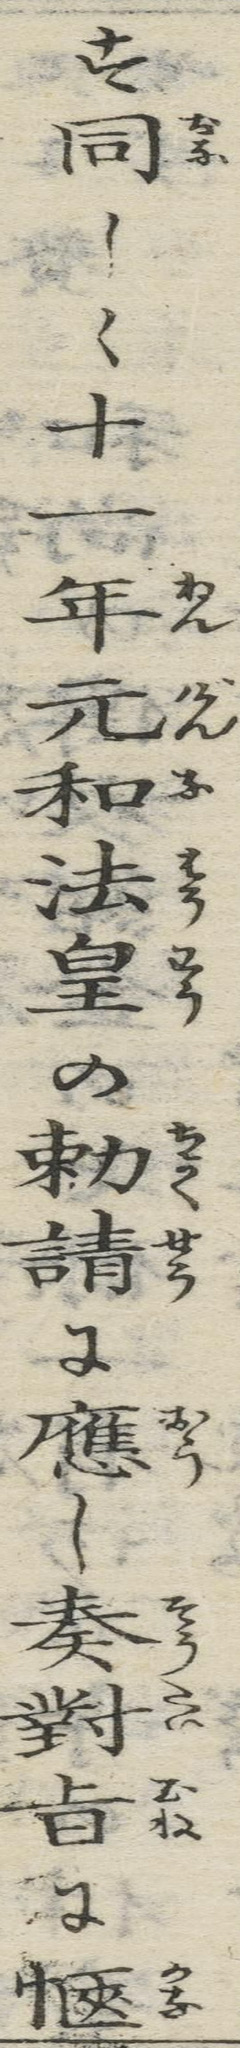す同じく十一年元和法皇の勅請に応じ奏対旨に愜
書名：豆州熱海誌　完
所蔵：東京大学地震研究所図書室 Earthquake Research Institute Library, The University of Tokyo, JAPAN
